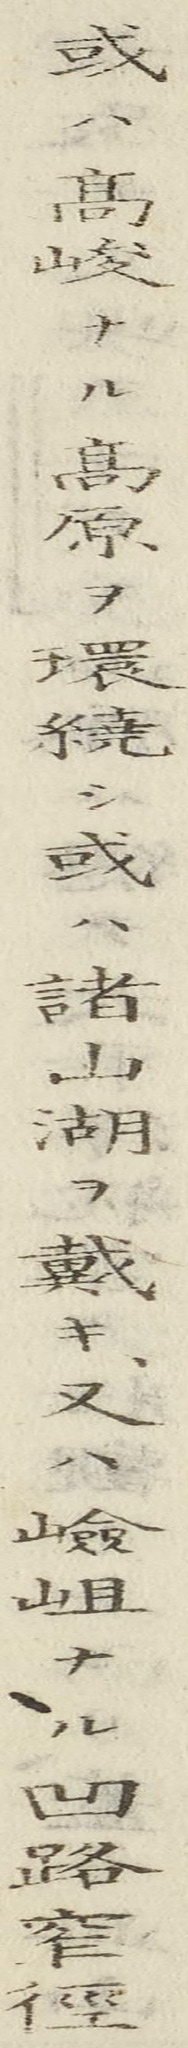或ハ高峻ナル高原ノ環繞シ或ハ諸山湖ヲ戴キ、又ハ嶮阻ナル凹路窄径
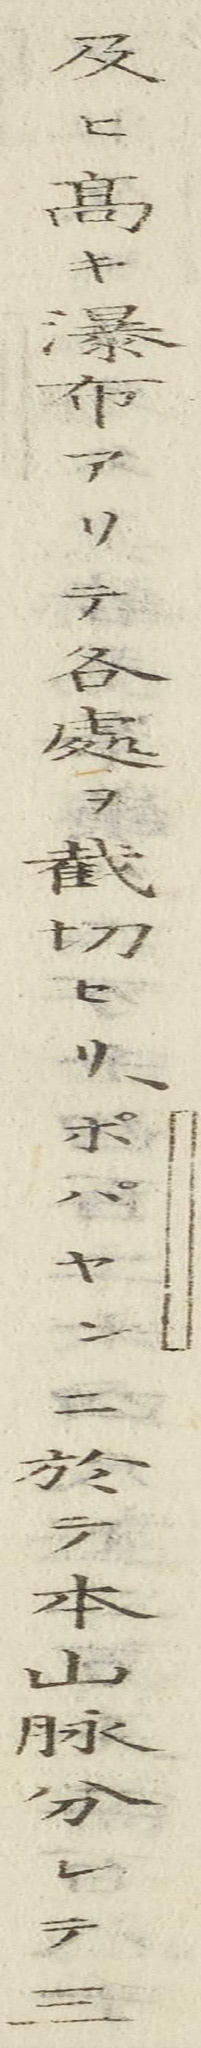及ヒ高キ瀑布アリテ各処ヲ截切セリ、ポパヤンニ於テ本山脉分レテ三
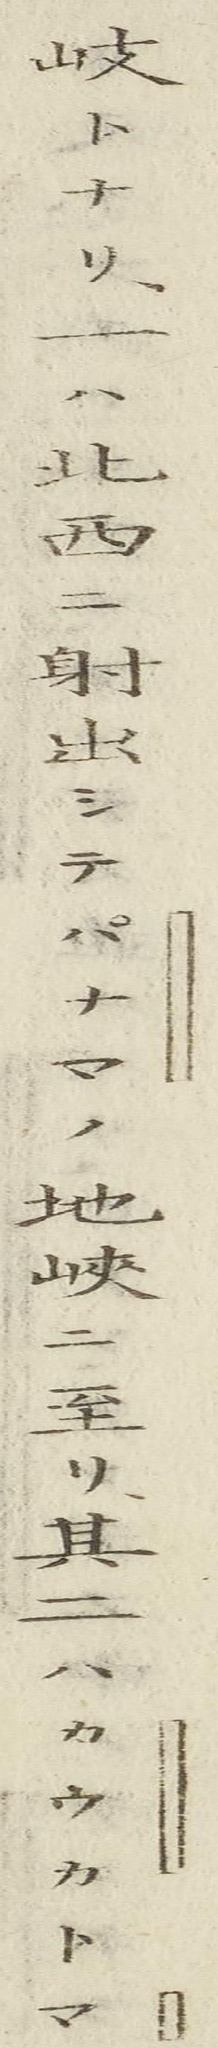岐トナリ、一ハ北西ニ射出シテパナマノ地峡ニ至リ、其二ハカウカトマ
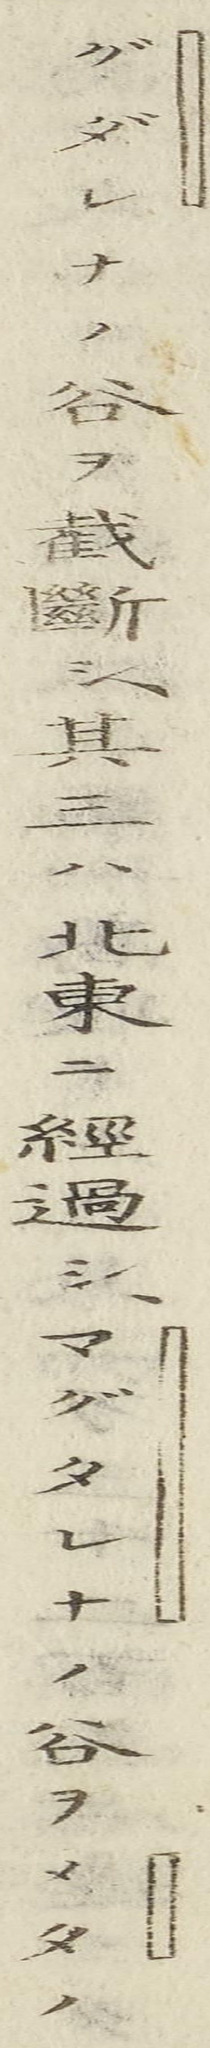グダレナノ谷ヲ截断シ、其三ハ北東ニ経過シ、マグタレナノ谷ヲメタノ
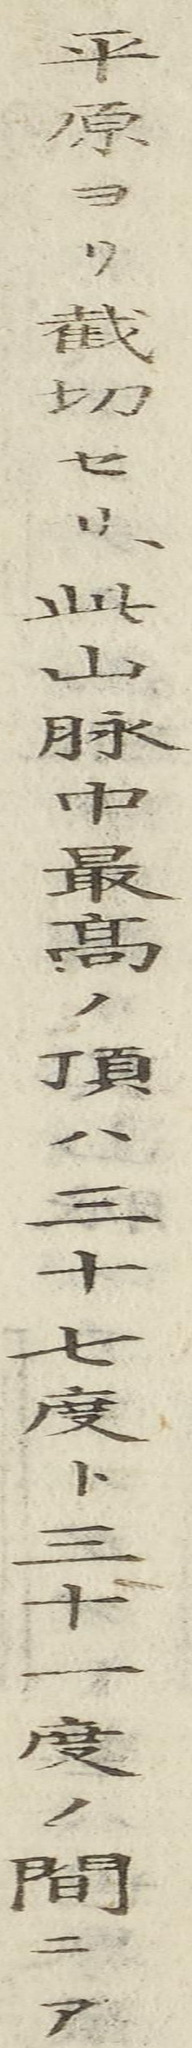平原ヨリ截切セリ、此山脉中最高ノ頂ハ三十七度ト三十一度ノ間ニア

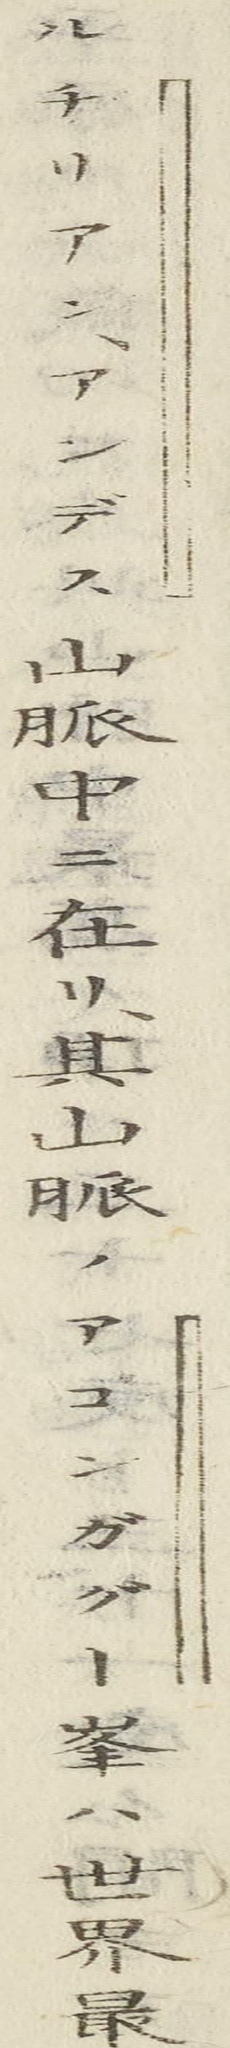ルチリアン、アンデス山脈中ニ在リ、其山脈ノアコンガグー峯ハ世界最
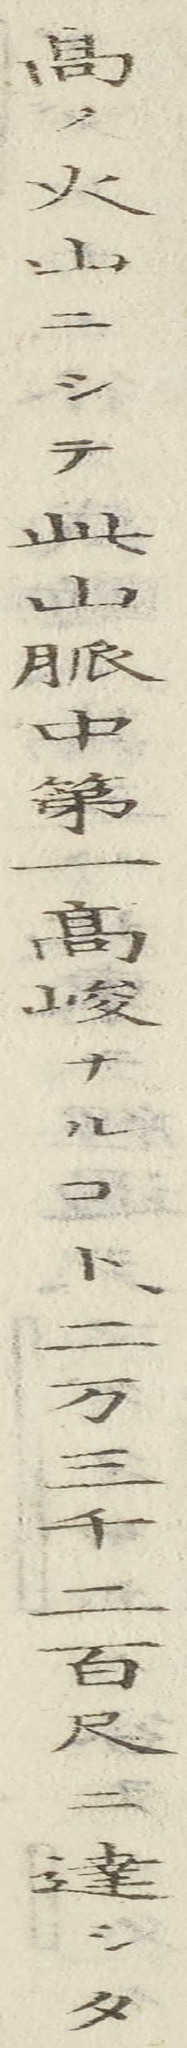高ノ火山ニシテ此山脈中第一高峻ナルコト、二万三千二百尺ニ達シタ
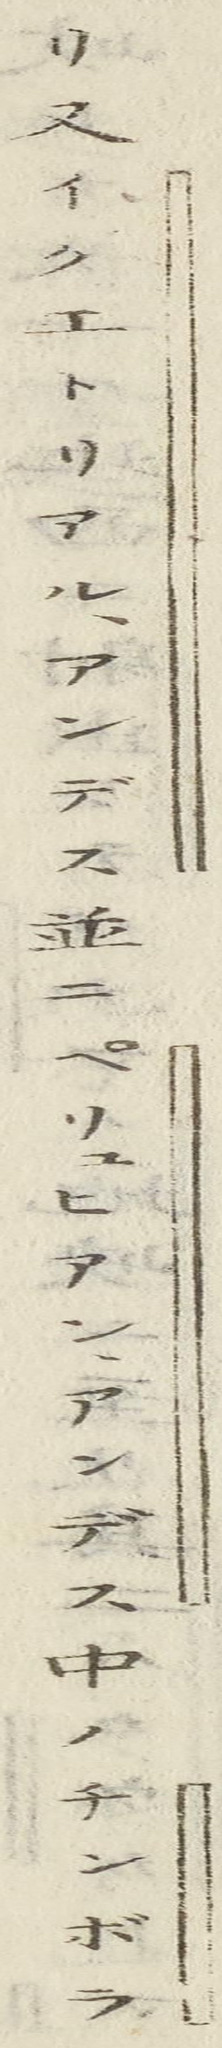リ又イクエトリアル、アンデス並ニペリュヒアン、アンデス中ノチンボラ
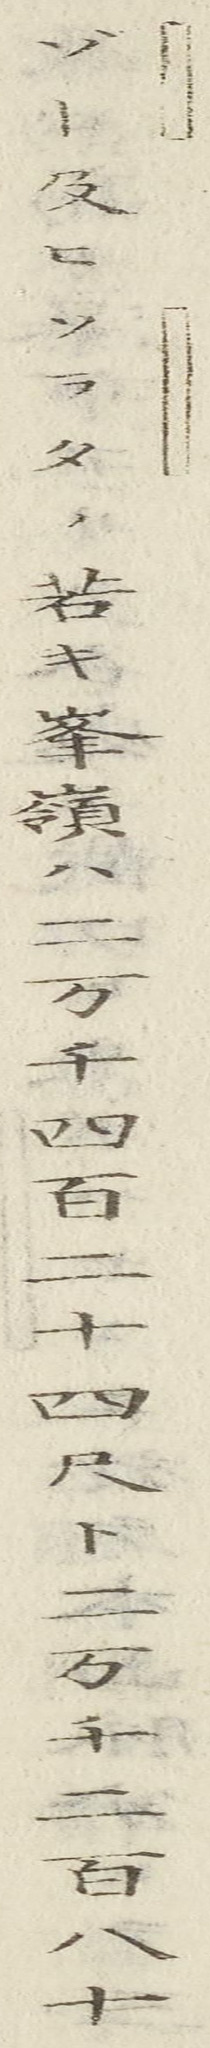ゾー及ヒソラタノ若キ峯嶺ハ二万千四百二十四尺ト二万千二百八十
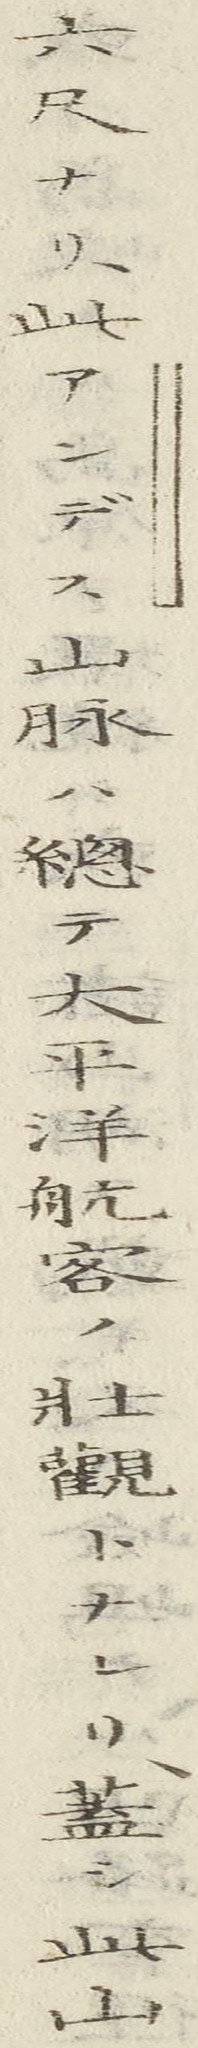六尺ナリ、此アンデス山脉ハ総テ大平洋航客ノ壮観トナレリ、蓋シ此山
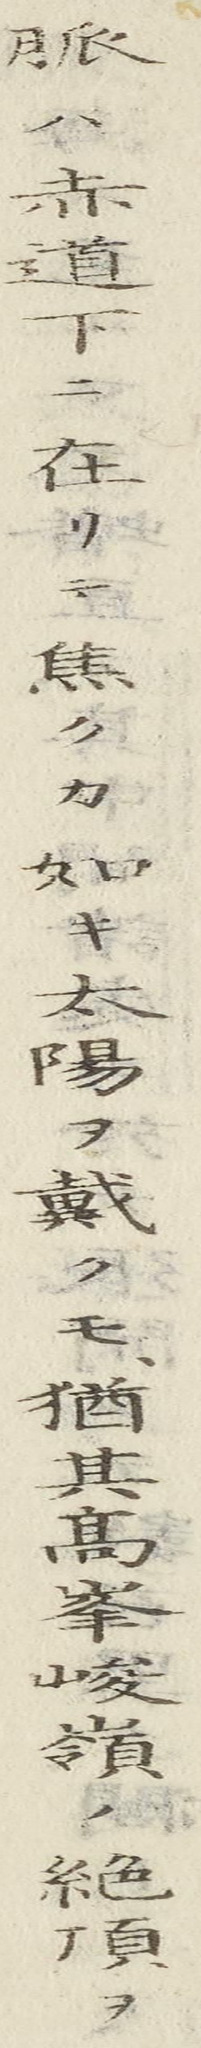脈ハ赤道下ニ在リテ焦クカ如キ太陽ヲ戴クモ、猶其高峯峻嶺ノ絶頂ヲ
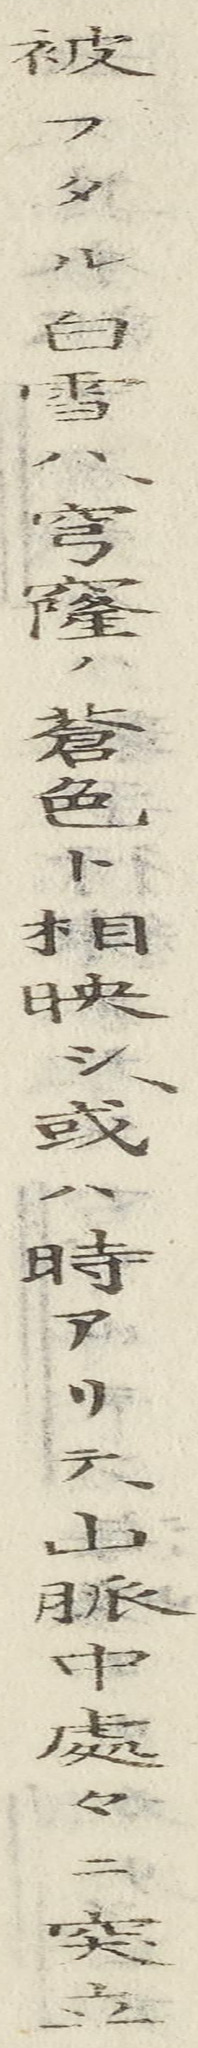被フタル白雪ハ、穹窿ノ蒼色ト相映シ、或ハ時アリテ、山脈中処々ニ突立
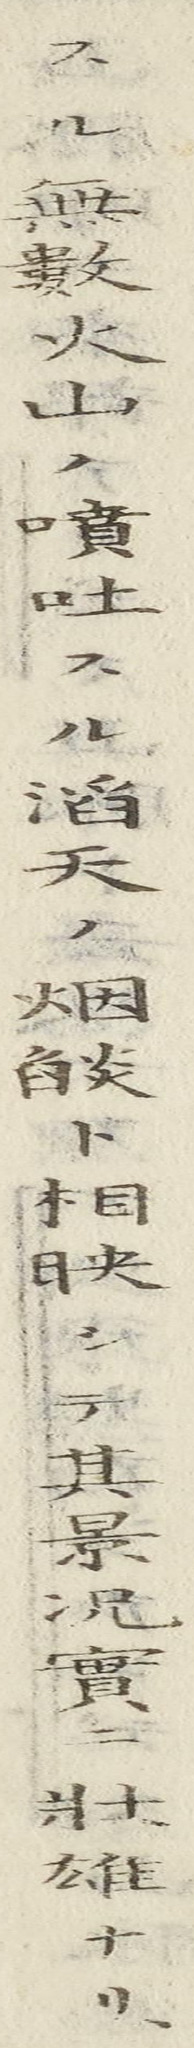スル無数火山ノ噴吐スル滔天ノ烟燄ト相映シテ其景況実ニ壮雄ナリ、
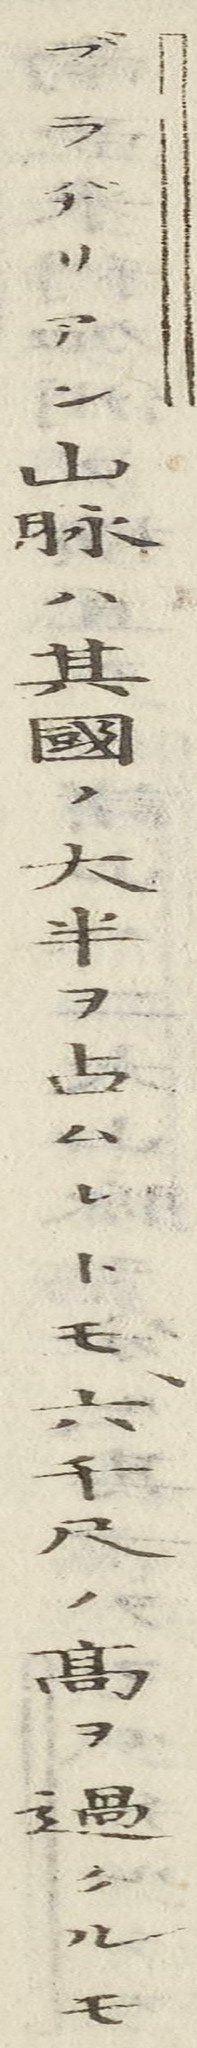ブラヂリアン山脉ハ其国ノ大半ヲ占ムレトモ、六千尺ノ高ヲ過クルモ
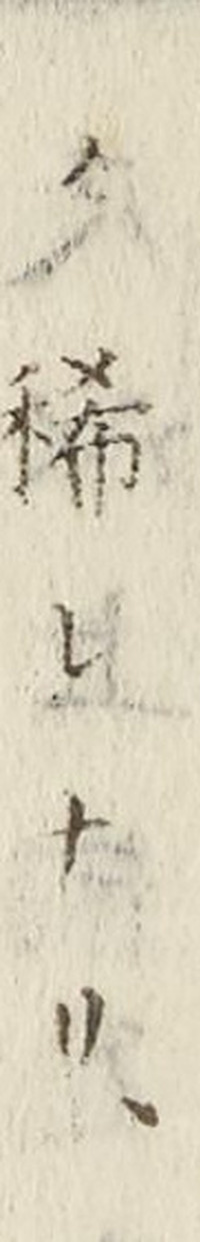ノ稀レナリ、
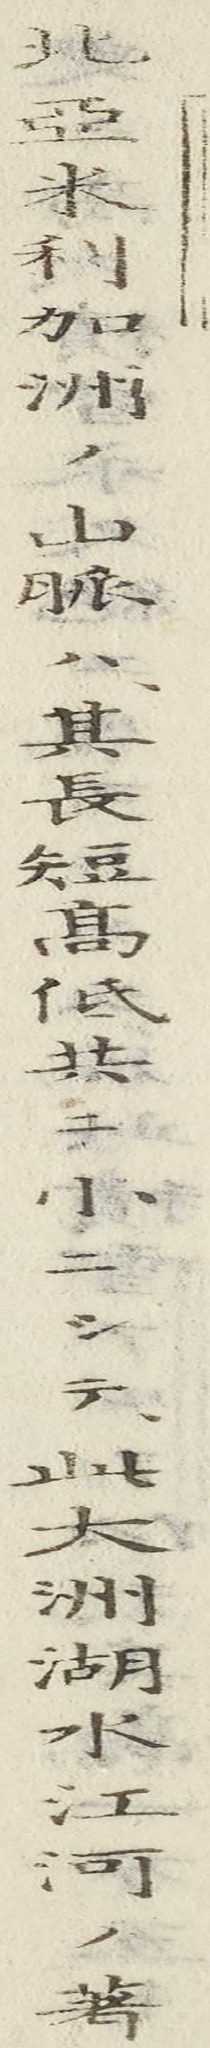北亜米利加洲ノ山脈ハ、其長短高低共ニ小ニシテ、、此大洲湖水江河ノ著
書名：百科全書　地文學　全
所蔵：東京大学地震研究所図書室 Earthquake Research Institute Library, The University of Tokyo, JAPAN
